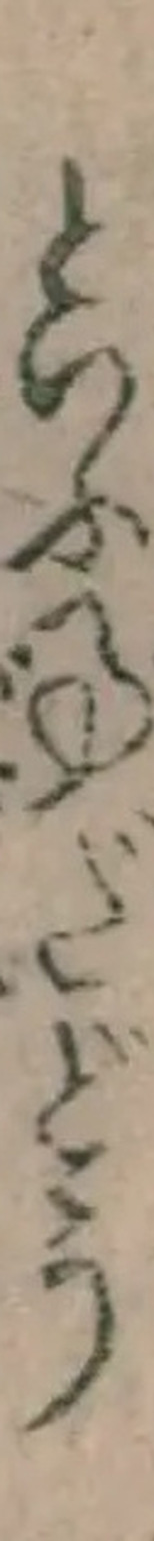といふ事だどう
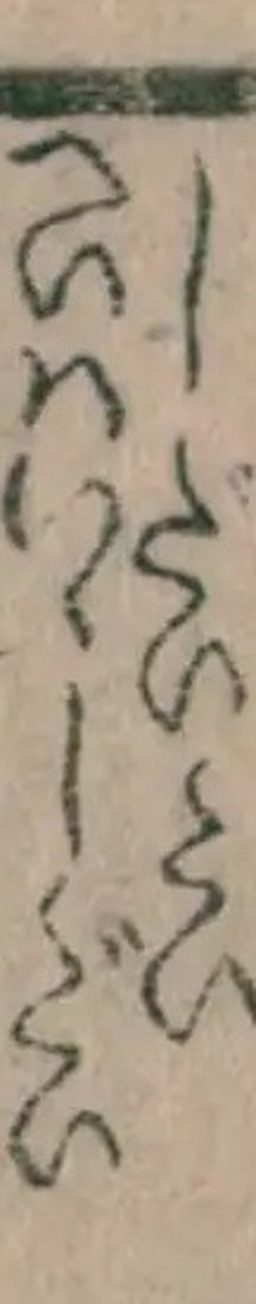へいはいゝしだい
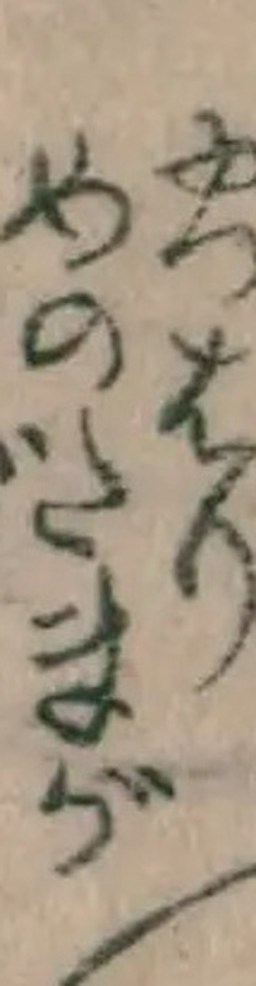めのたまが
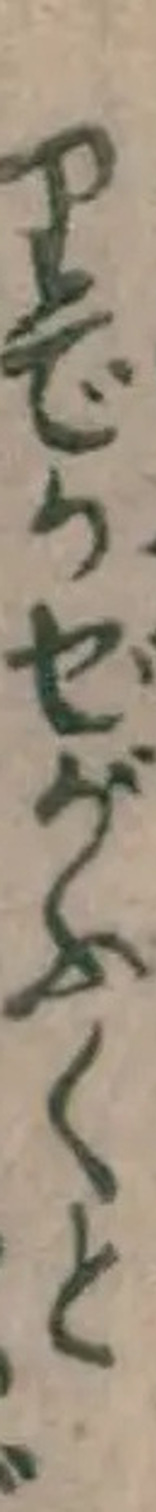りでかぜがふくと
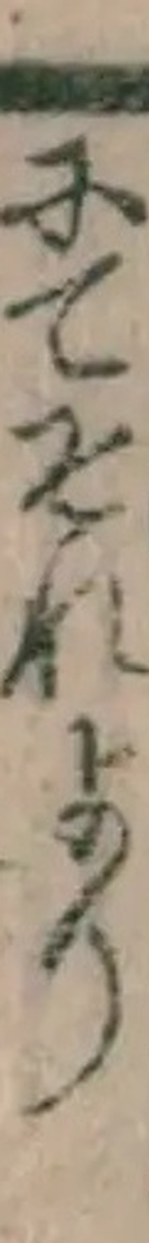にてそれより
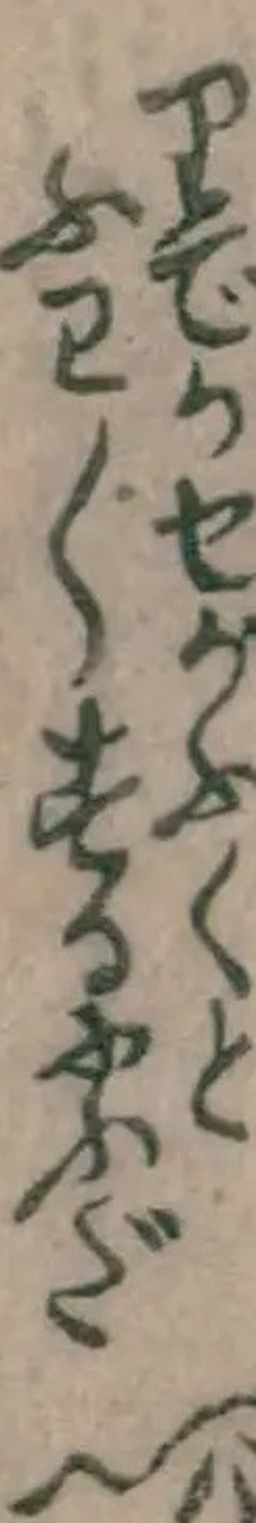ふわ〳〵するやふだ
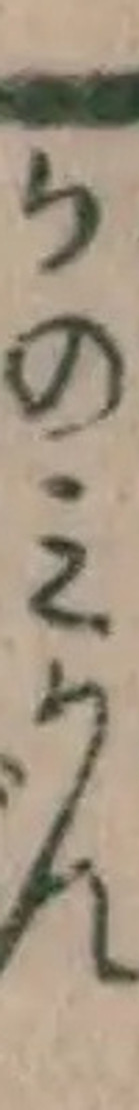かのみかん
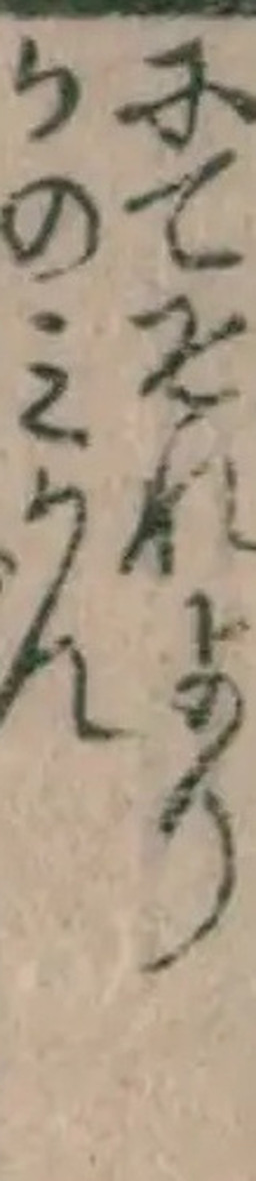かのみかん
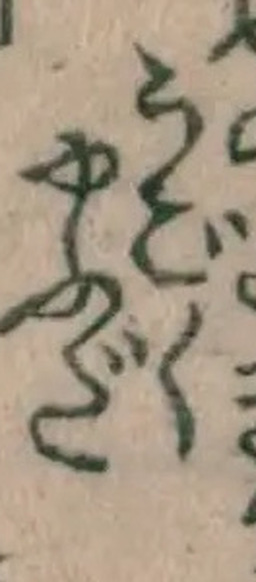やふだ
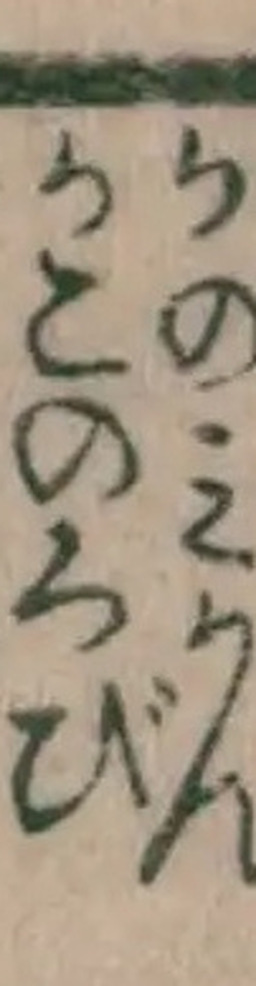かこのくび
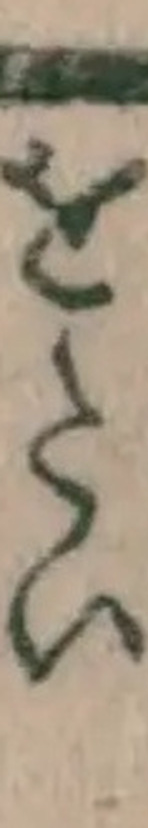をたい
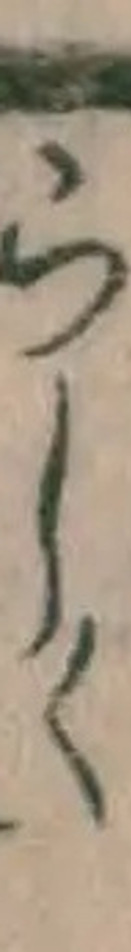らしく
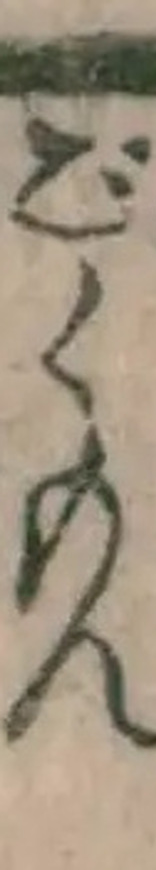ごくもん
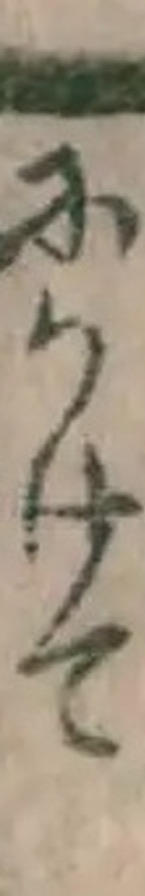にかけて
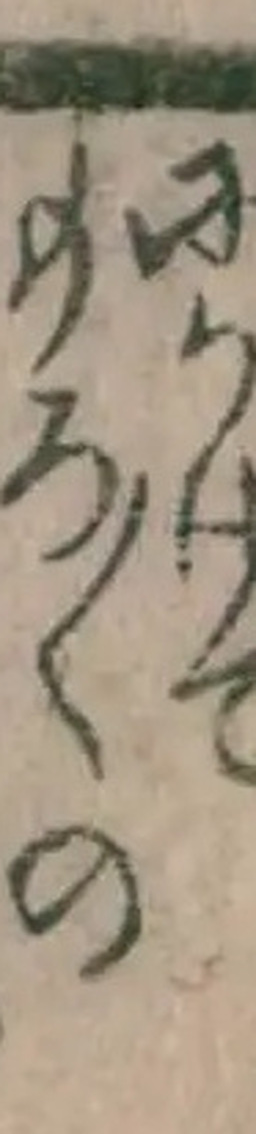もろ〳〵の
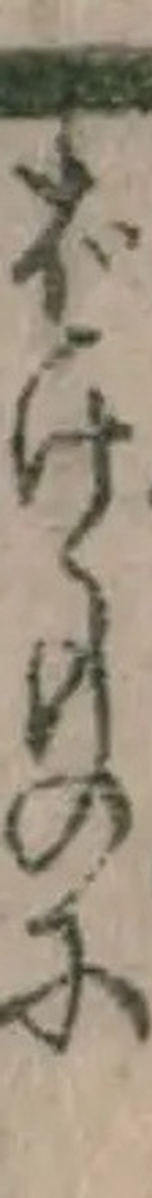ばけものに
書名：信有奇怪会
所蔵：国立国会図書館 National Diet Library, JAPAN
